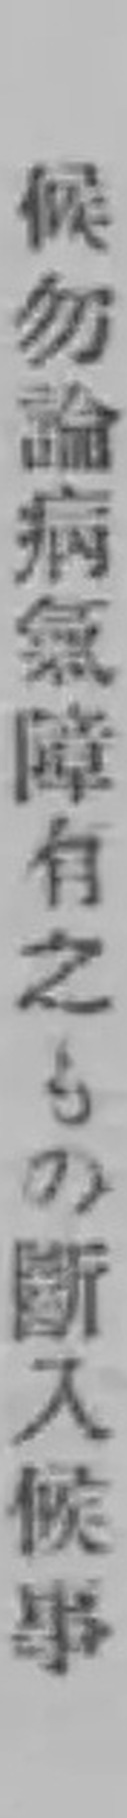候勿論病気障有之もの断入候事
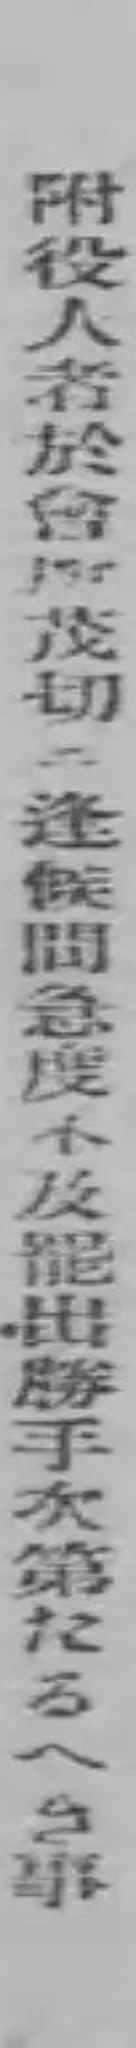附役人者於会所茂切ニ逢候間急度不及罷出勝手次第たるへき事
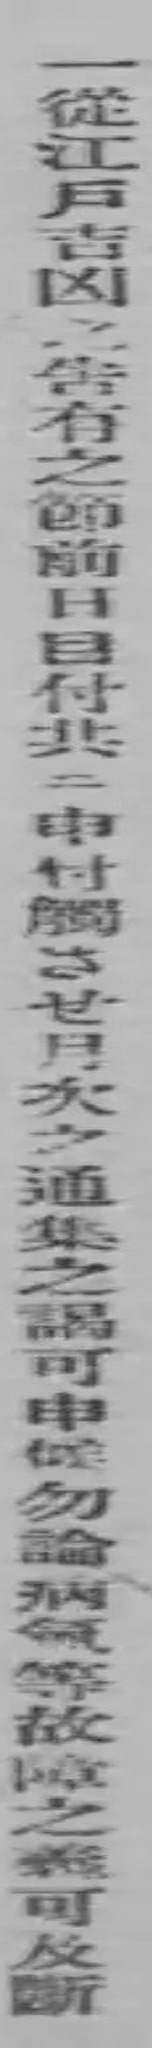一従江戸吉凶之告有之節前日目付共ニ申付触させ月次之通集之謁可申候勿論病気等故障之義可及断
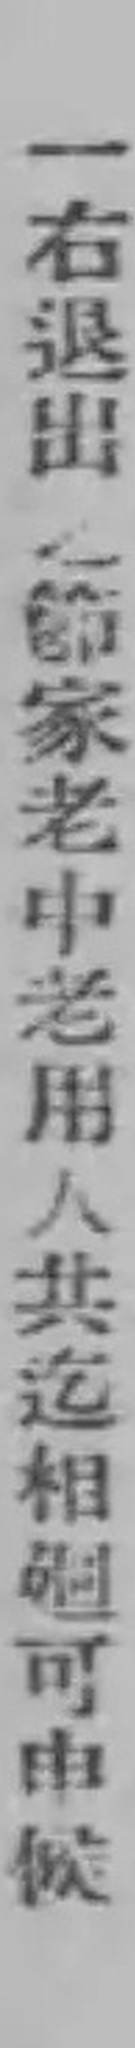一右退出之節家老中老用人共迄相廻可申候
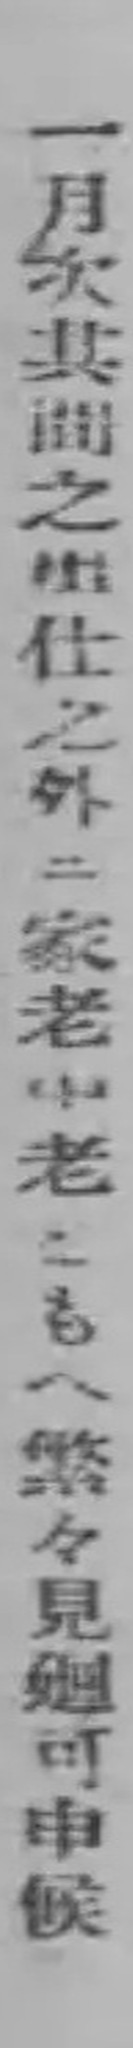一月次其間之出仕之外ニ家老中老用ともへ繁々見廻可申候

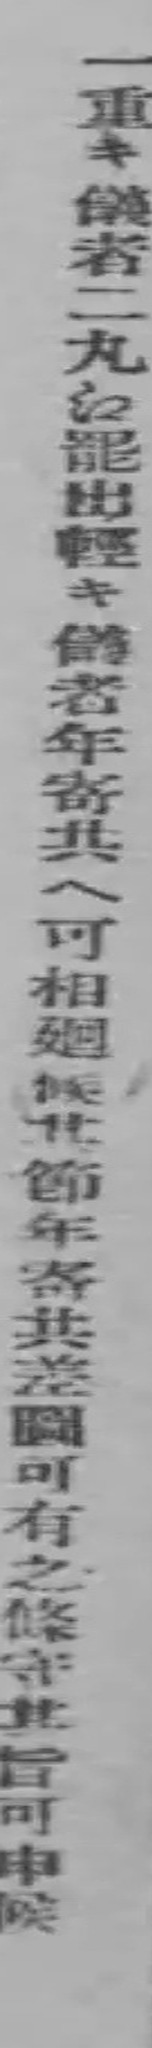一重キ儀者二丸え罷出軽キ儀者年寄共へ可相廻候其節年寄共差図可有之条守其旨可申候
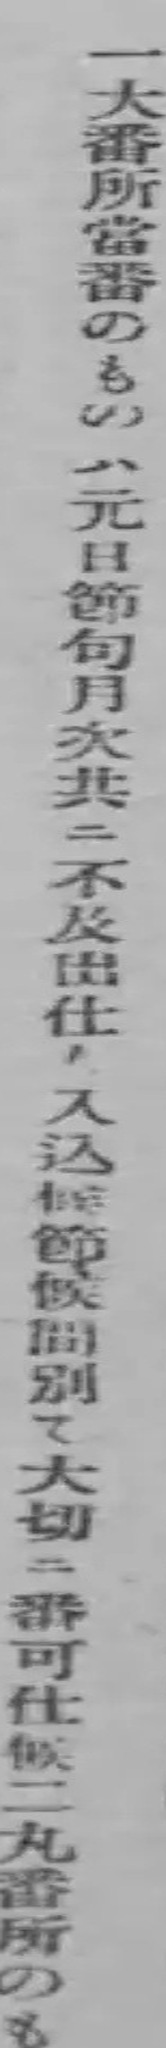一大番所当番のものは元日節句月次共ニ不及出仕人入込候節候間別て大切ニ番可仕候二丸番所のも
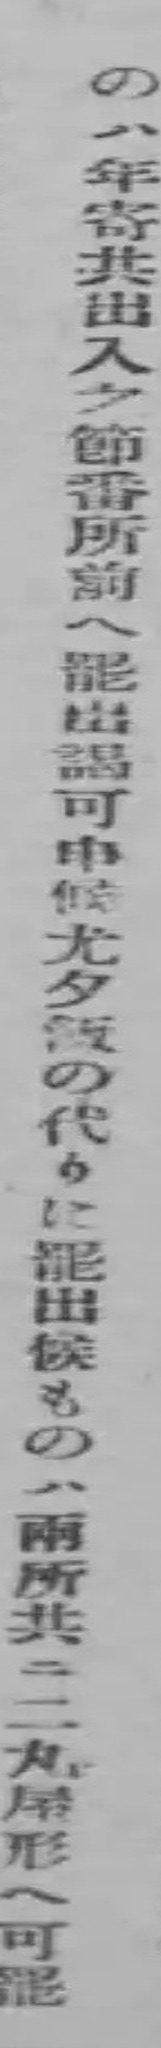のは年寄共出入之節番所前へ罷出謁可申候尤夕飯の代りに罷出候ものは両所共ニ二丸屋形へ可罷
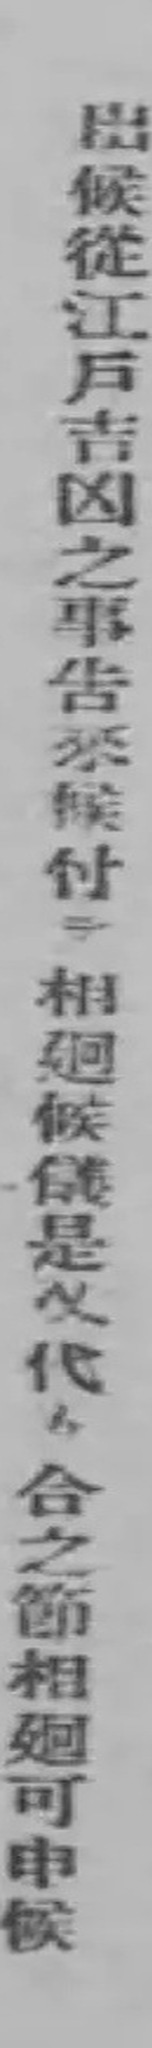出候従江戸吉凶之事告来候付テ相廻候儀是又代り合之節相廻可申候
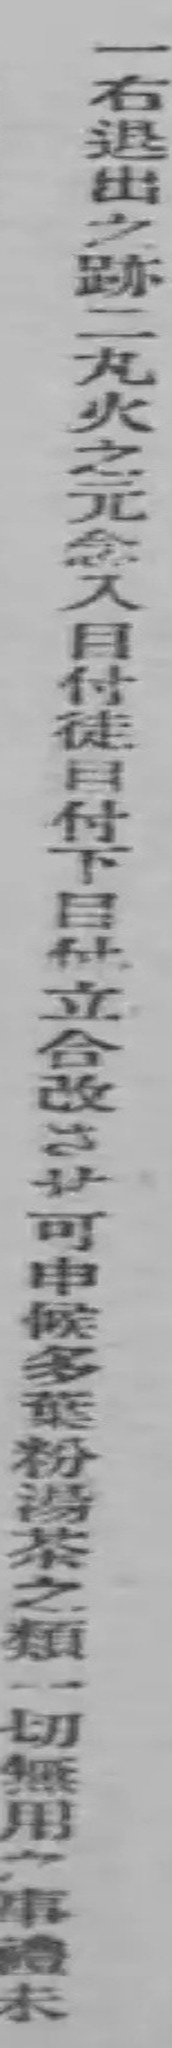一右退出之跡二丸火之元念入目付徒目付下目付立合改させ可申候多葉粉湯茶之類一切無用之事礼未
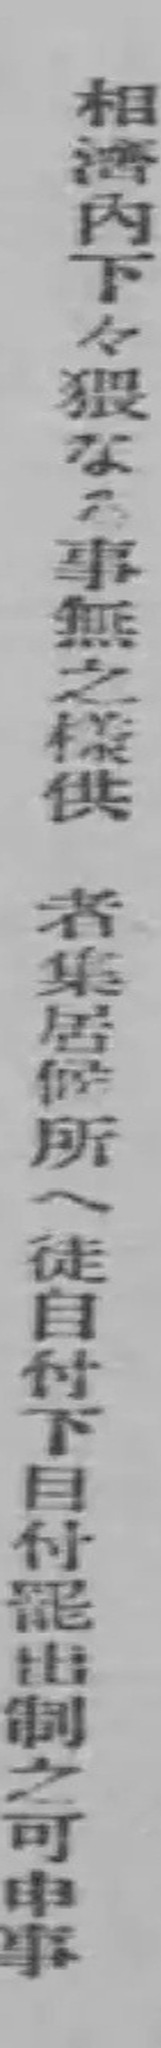相済内下々猥なる事無之様供者集居候所へ徒目付下目付罷出制之可申事
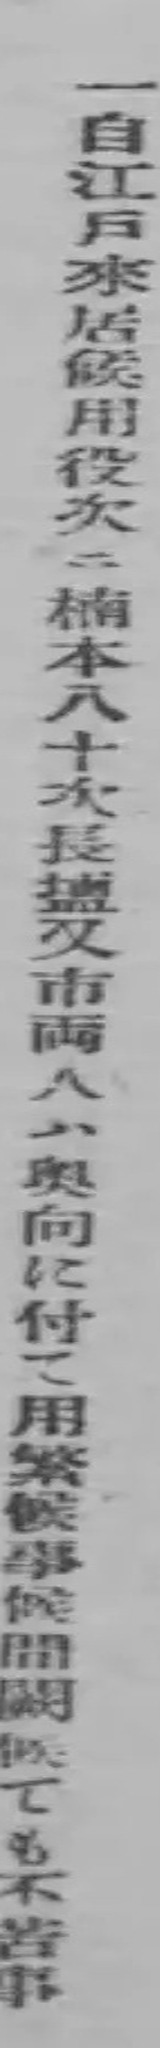一自江戸来居候用役次ニ楠本八十次長塩又市両人は奥向に付て用繁候事候間闕候ても不苦事
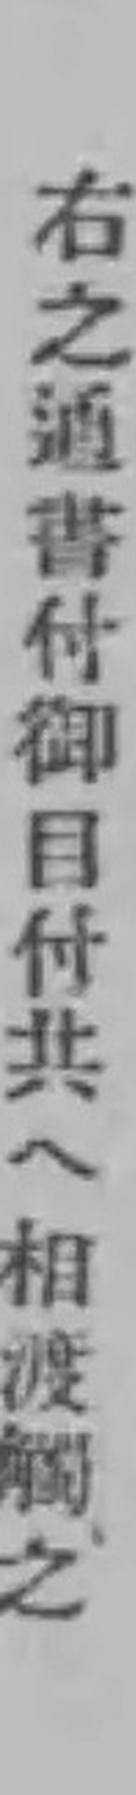右之通書付御目付共へ相渡触之
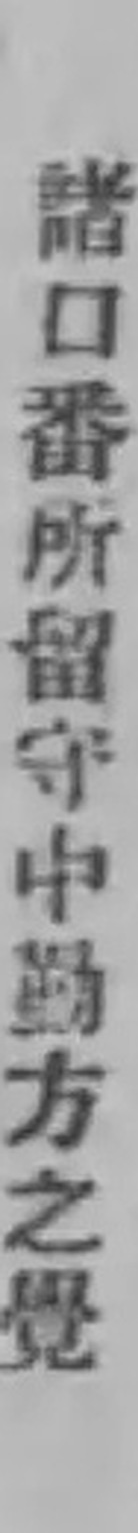諸口番所留守中勤方之覚
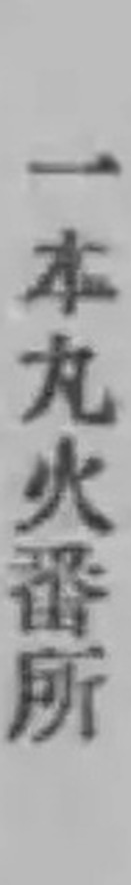一二丸侍番所
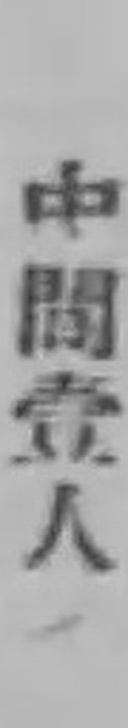中間壱人
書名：豊橋市史談
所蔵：国立国会図書館 National Diet Library, JAPAN
